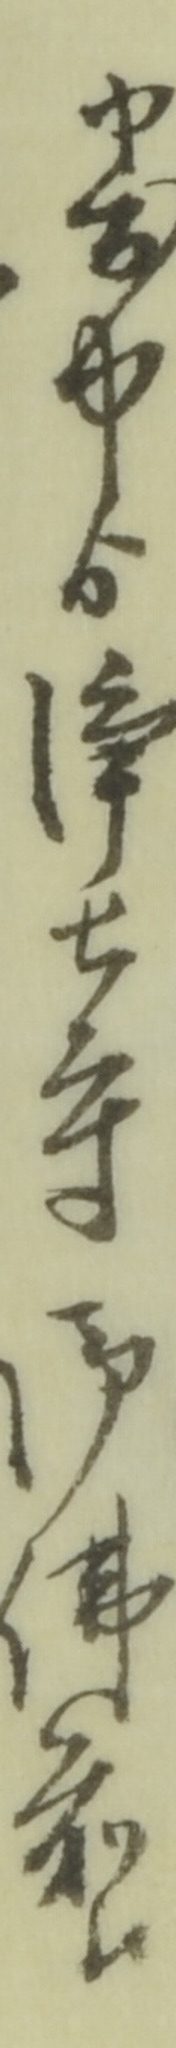寄中ゟ浄土寺御仏前江

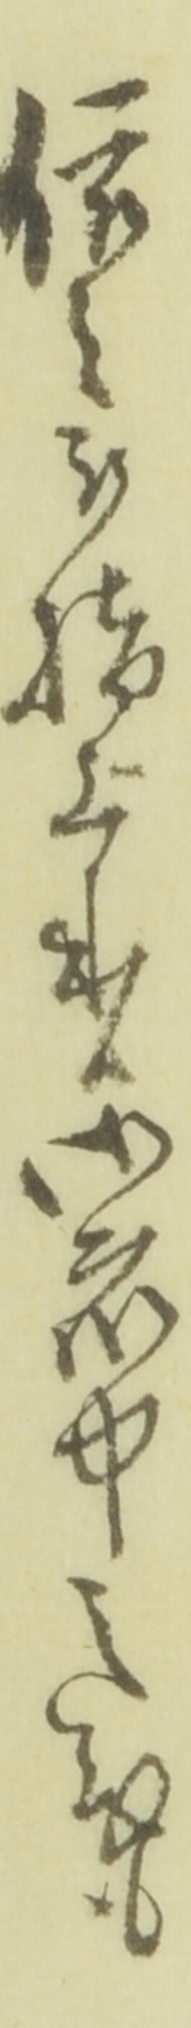依之被指上来候御衆中之義も
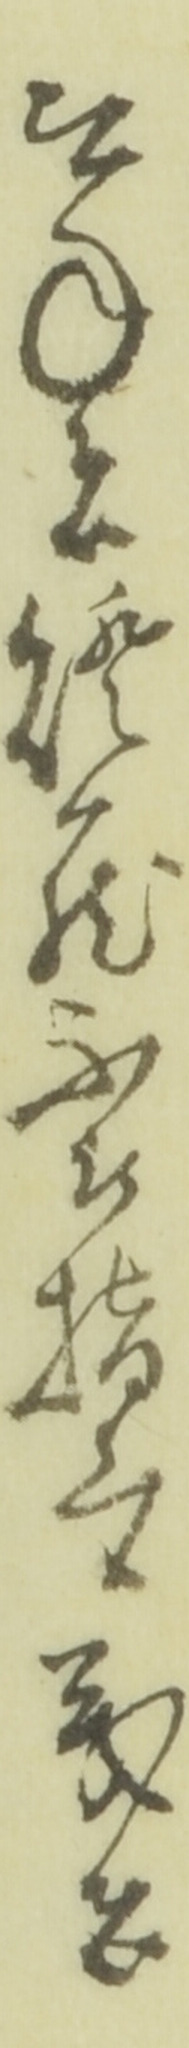去年者燈籠不被指上候義者
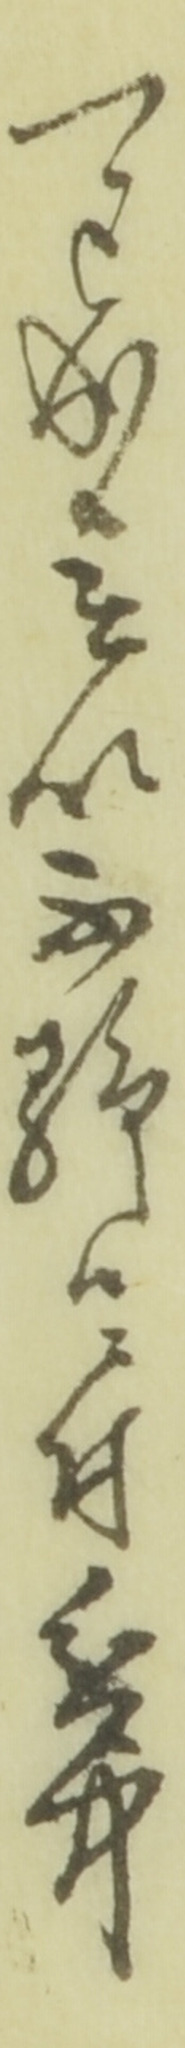可被成候を以不静候二付盆中
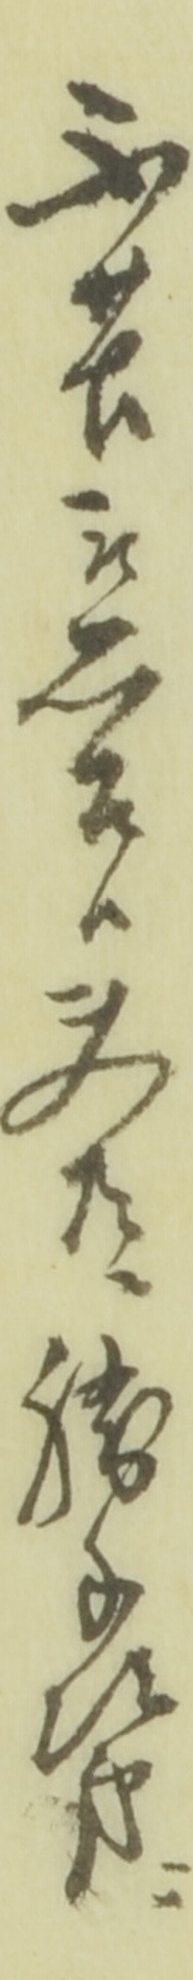不苦被思召候夫共へ勝手次第ニ
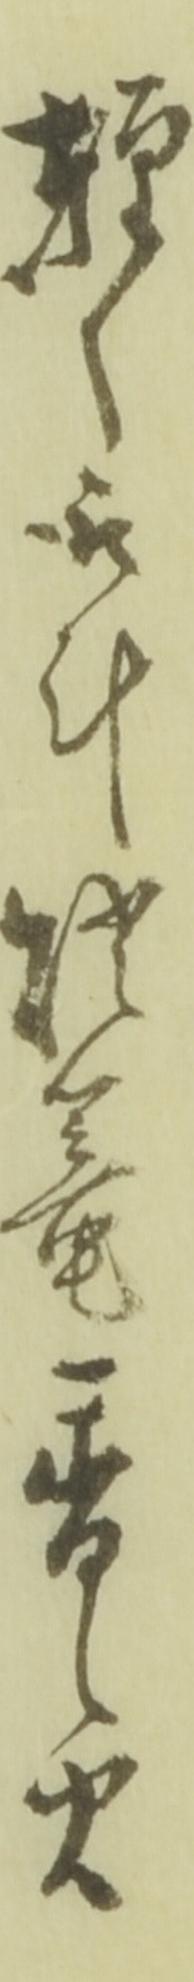軽〱取斗燈篭番之火
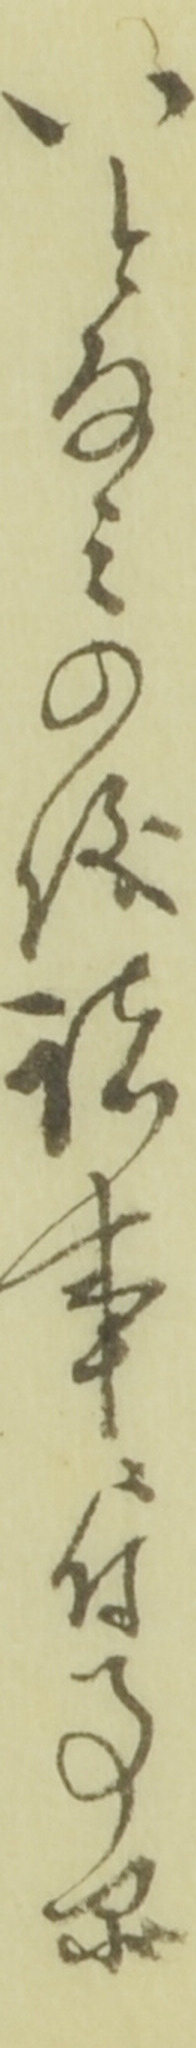いとなみの儀諸事ニ付事品
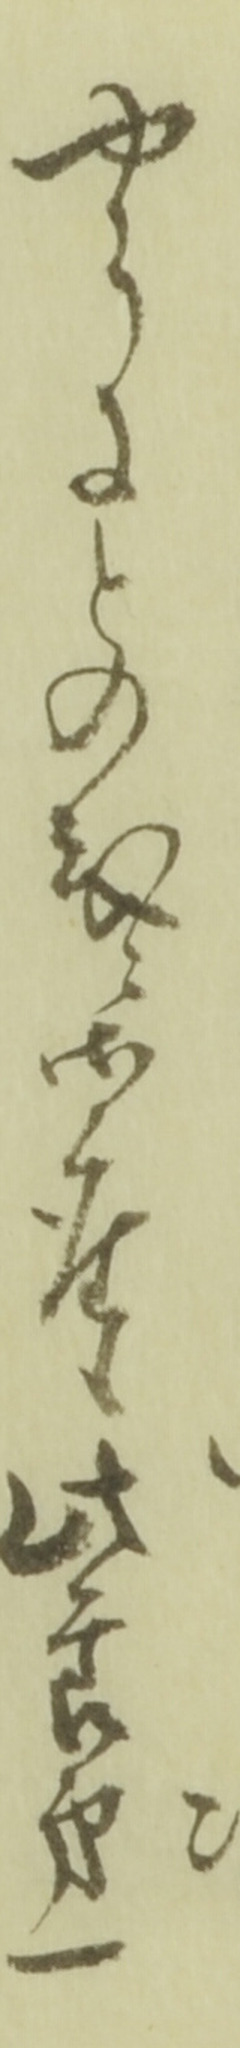やうにとの義ニ御座候此節第一
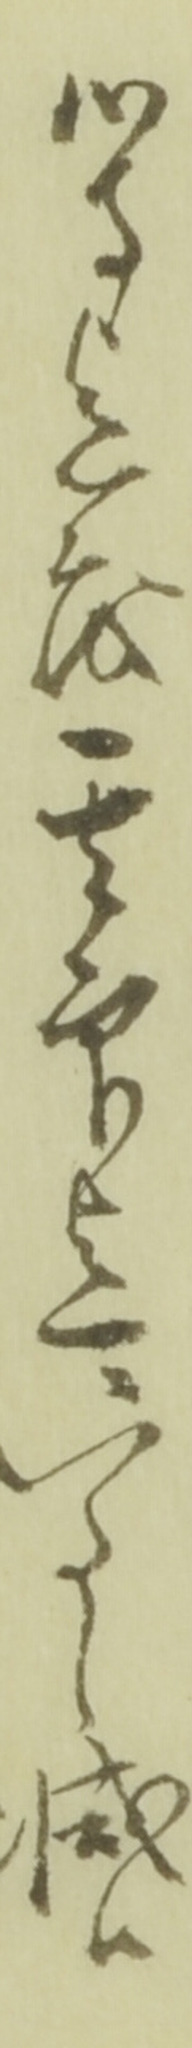等迄茂其印迄ニいたし減候
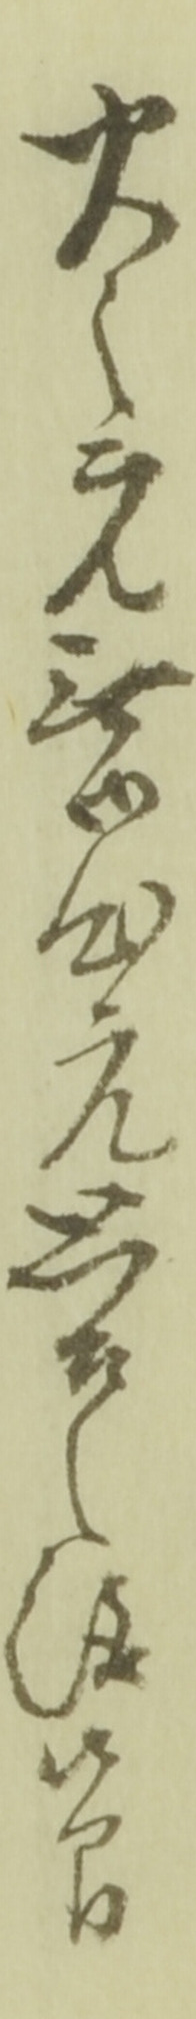火之元無御心元思召之趣候間
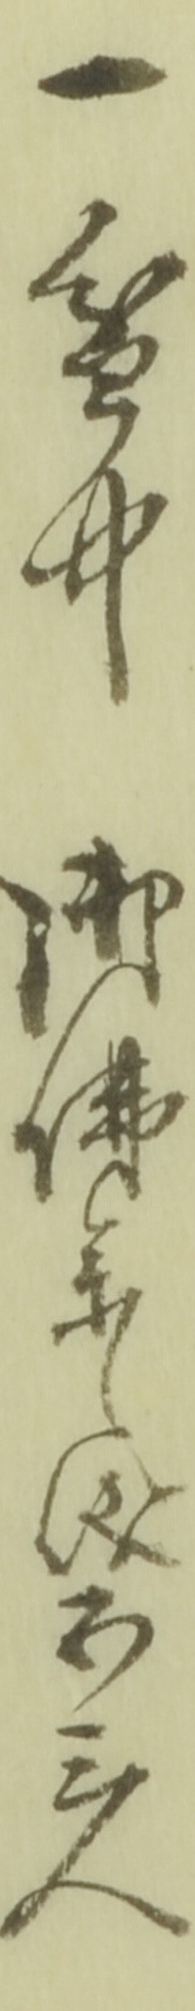一盆中御佛参之儀五三人
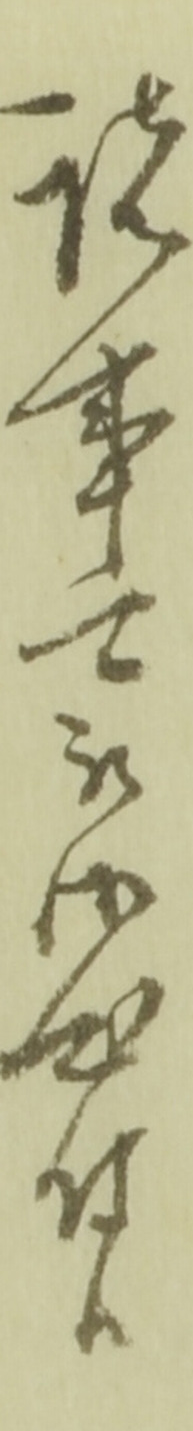諸事可被御心付候
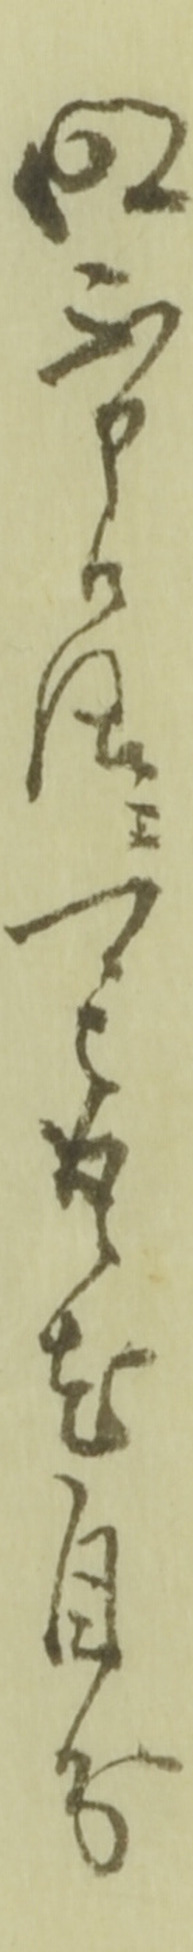明不申候様ニ可被成候尤自分
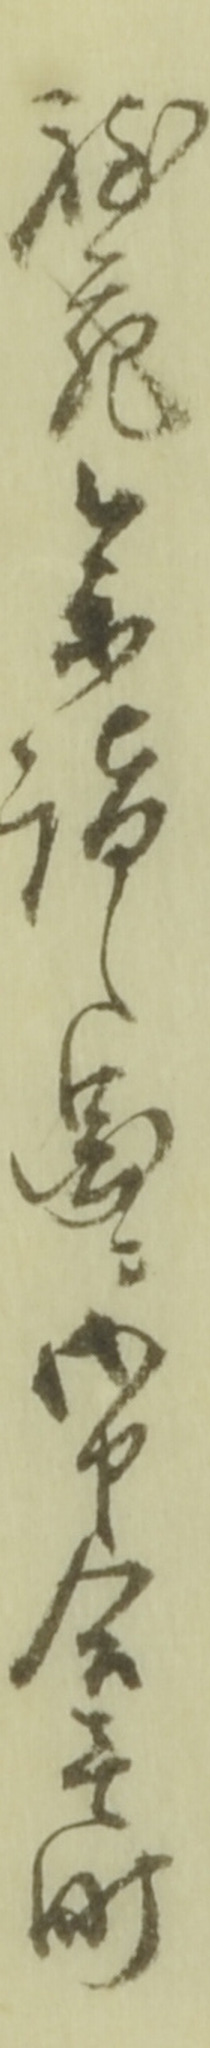程宛参詣之図ニ御申合壱町
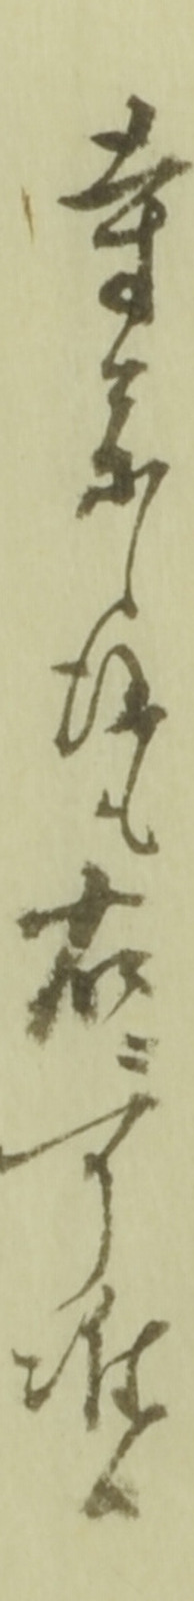寺参候儀も右ニ可准候
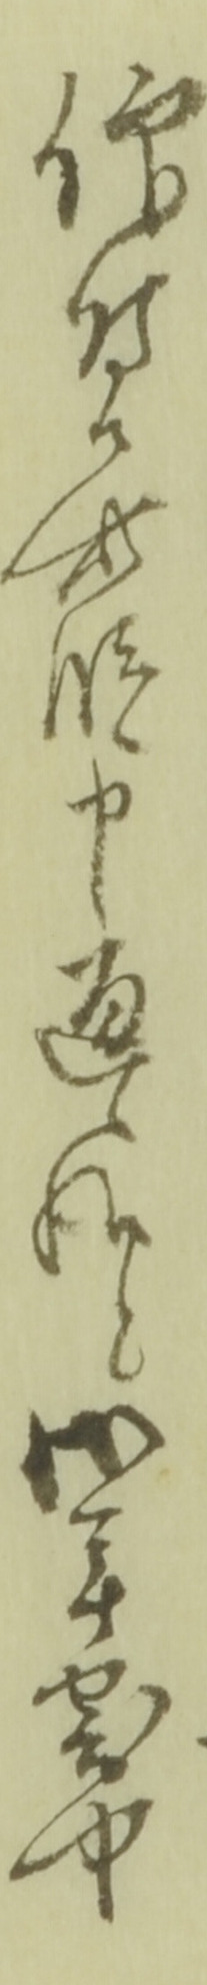仰付候此段申通候様ニ御年寄中
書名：御公儀様御領主様御触書控
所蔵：伊那市立高遠町図書館・合同会社AMANE
